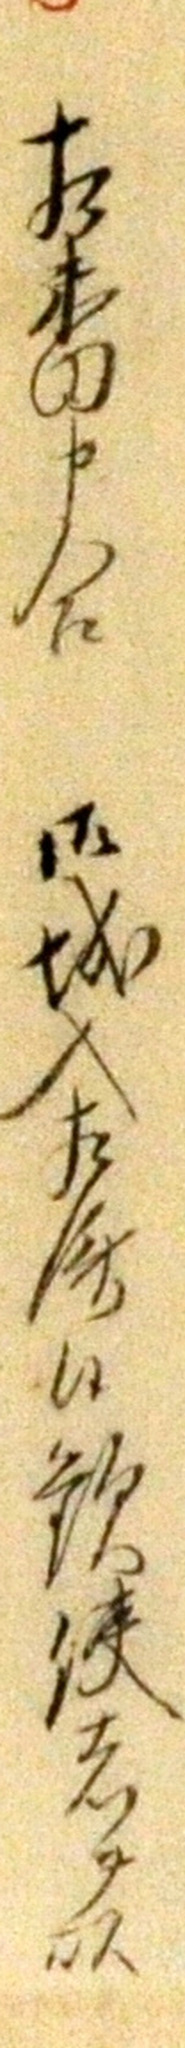相番申合御城入相済候歎使者ヲ以
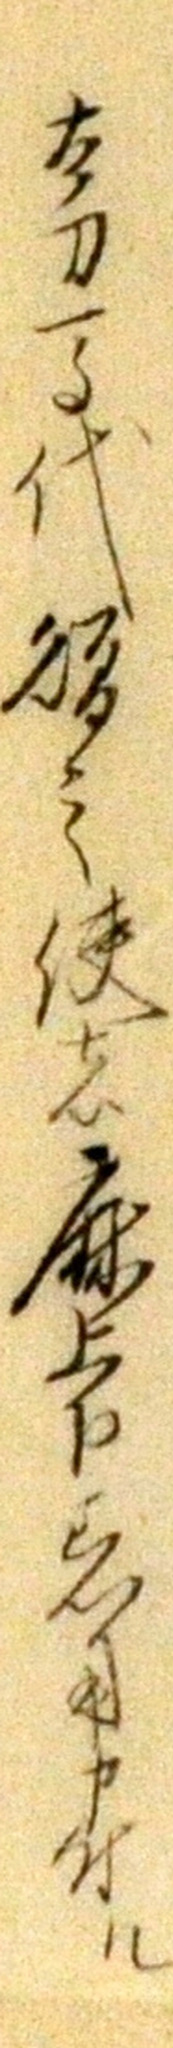太刀馬代贈之使者麻上下着用申付ㇽ
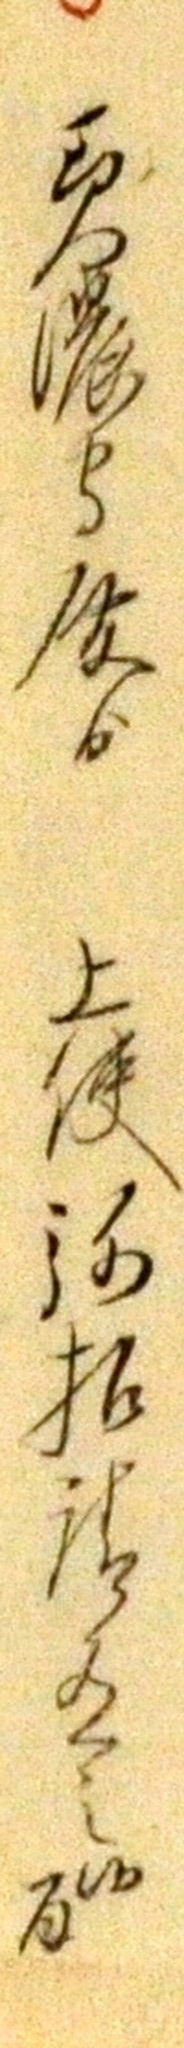美濃守殿ゟ上使弥招請有之候間
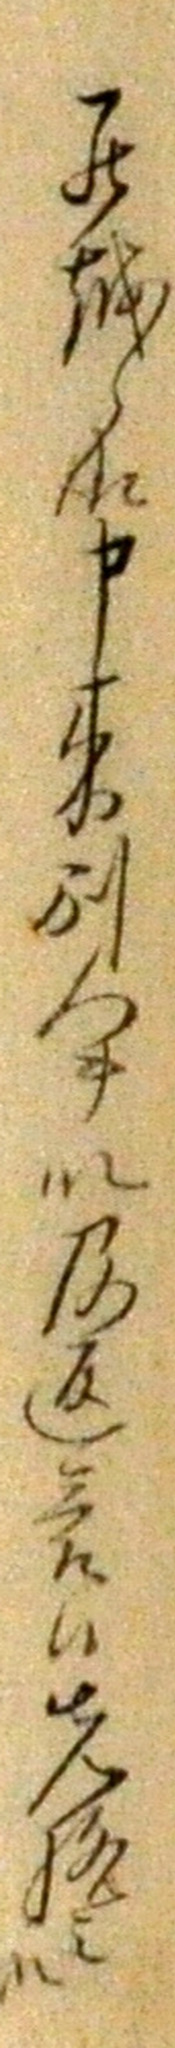罷越候様申来別人ヲ以及返答候先格之処
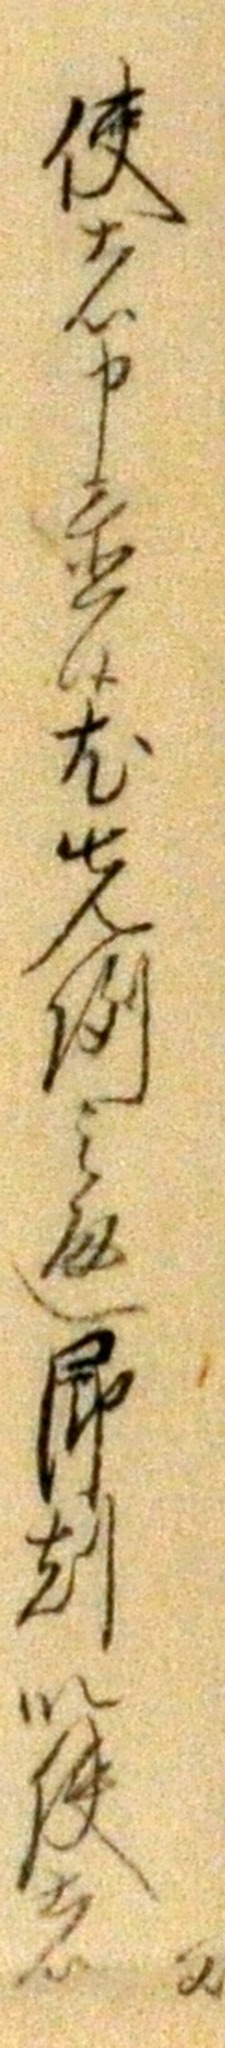使者申置候尤先例之通即刻以使者
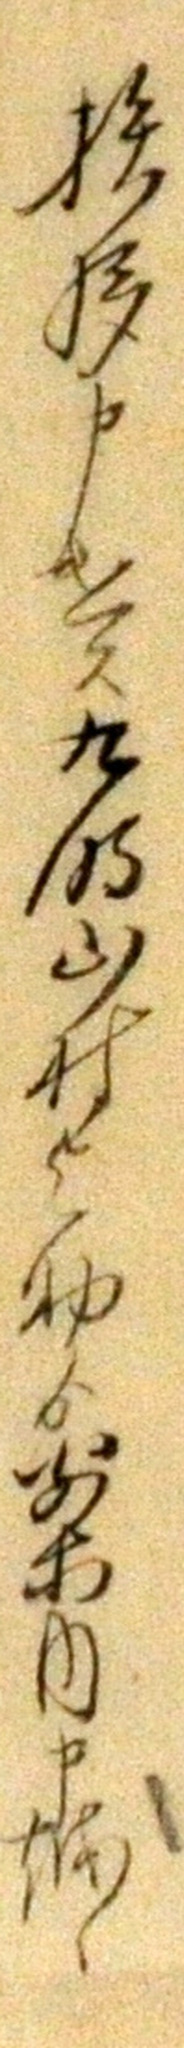挨拶申遣ス九時山村与助ゟ案内申越候
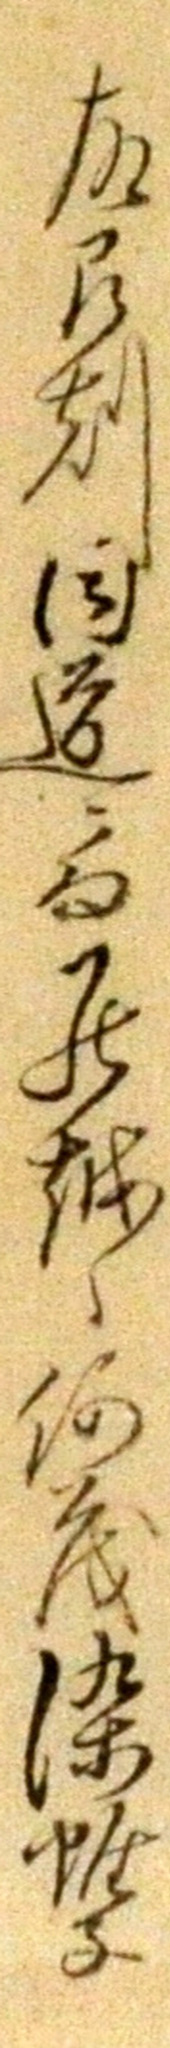故即刻同道ニ而罷越候何も染帷子
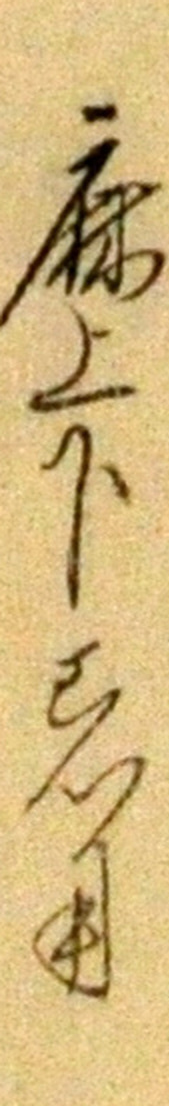麻上下着用
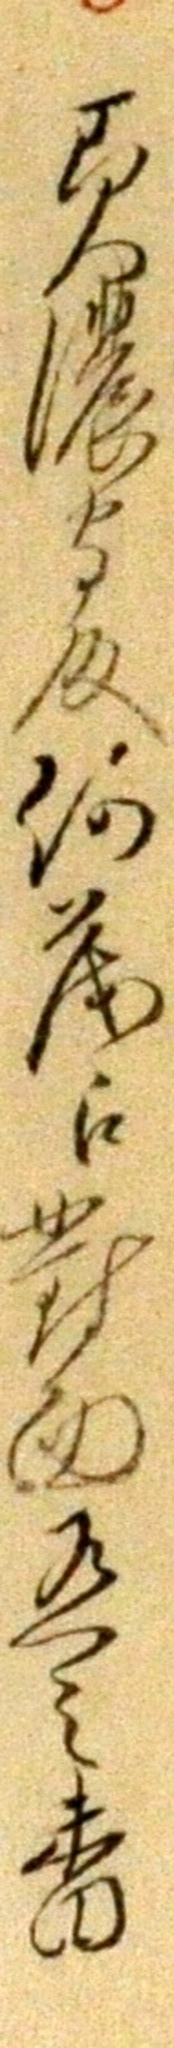美濃守殿何もえ対面有之番
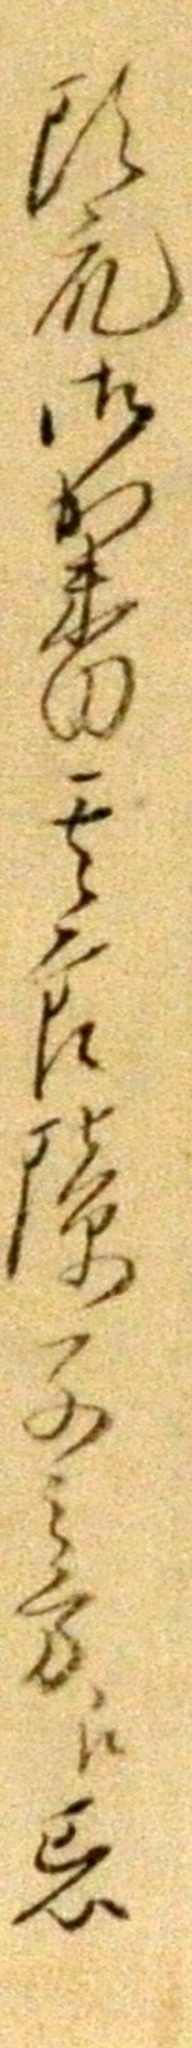頭衆御加番其節障子之方え着
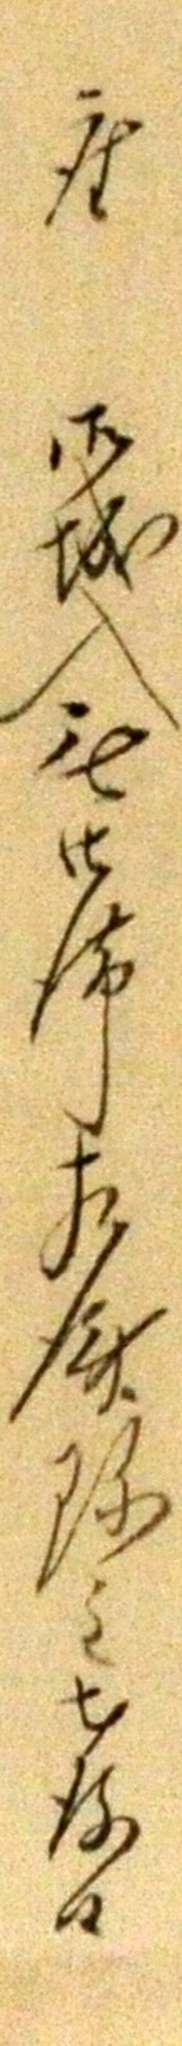座御城入無御滞相済珍重奉存候
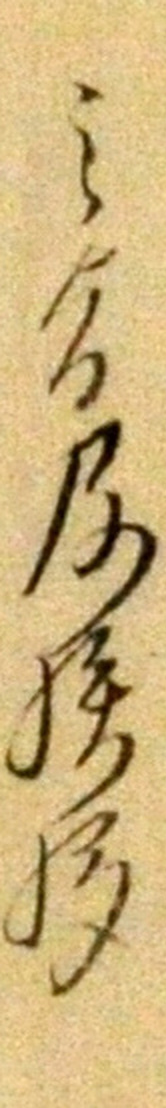之旨及挨拶
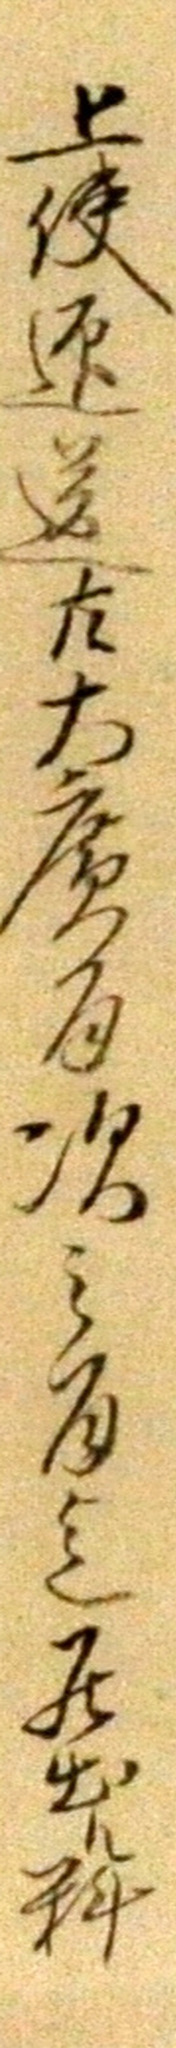上使迎送共大広間次之間迄罷出ル料
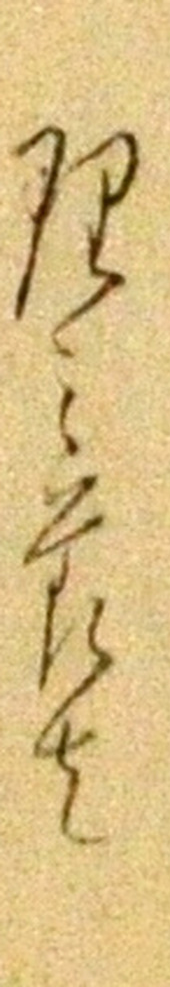理之節は
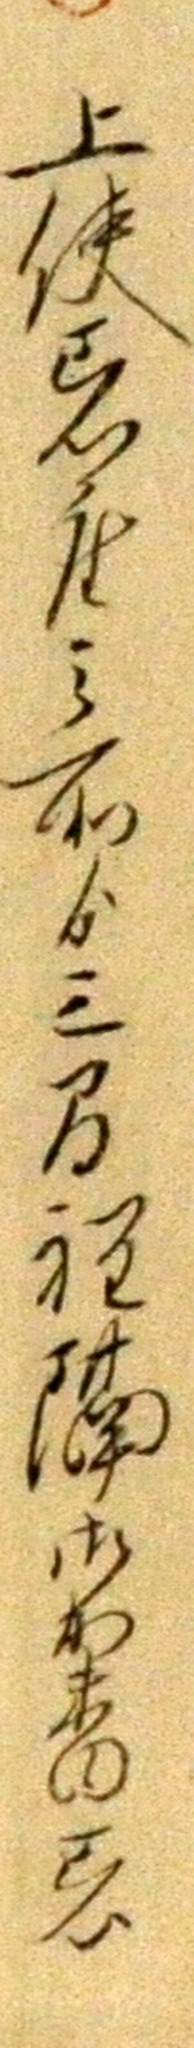上使着座之所ゟ三間程隔御加番着
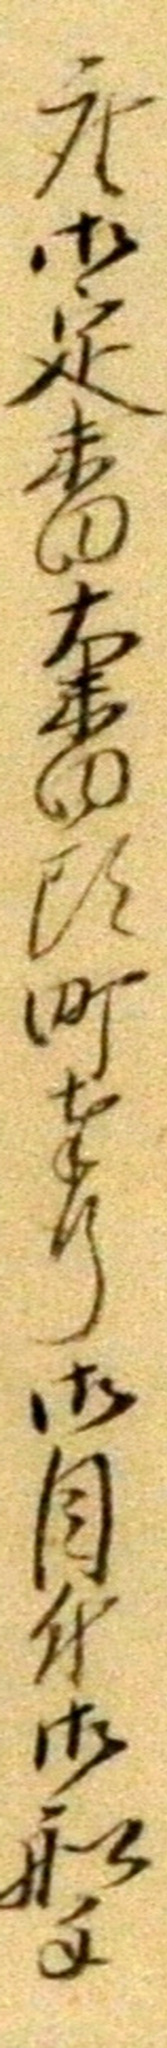座御定番大番頭町奉行御目付御船手
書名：大阪加番関係諸書留〔一括〕
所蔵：伊那市立高遠町図書館・合同会社AMANE
